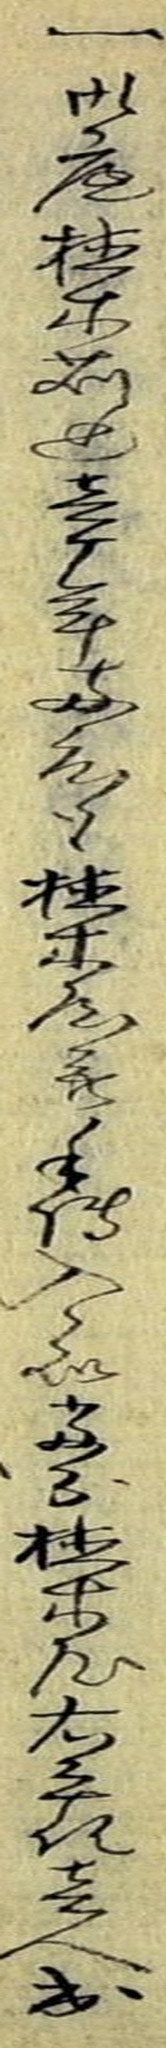一御庭植木苅込壱ヶ年両度つヽ植木屋并手伝入候処当分植木屋右平次壱人出
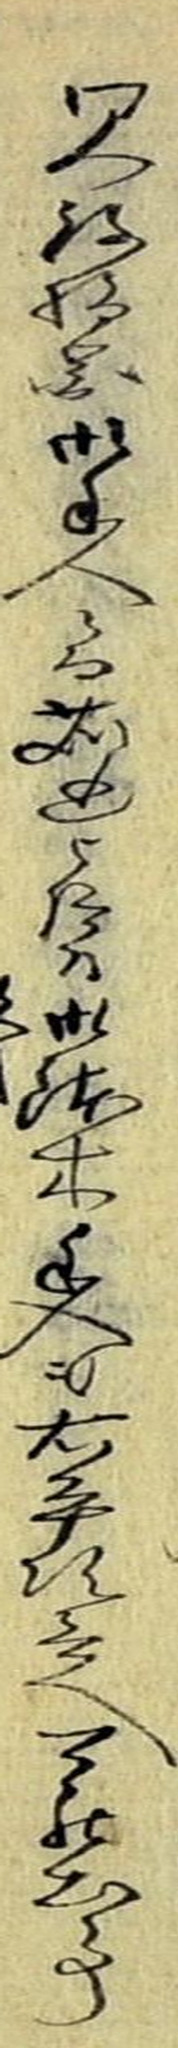同人致指図御手入に而苅込被仰付候御鉢木手入れも右平次壱人可罷出事
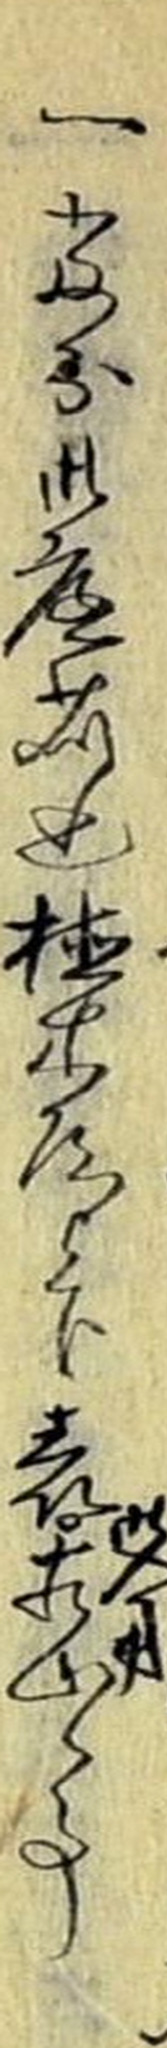一当分御庭苅込植木屋被下表御入用相止候事
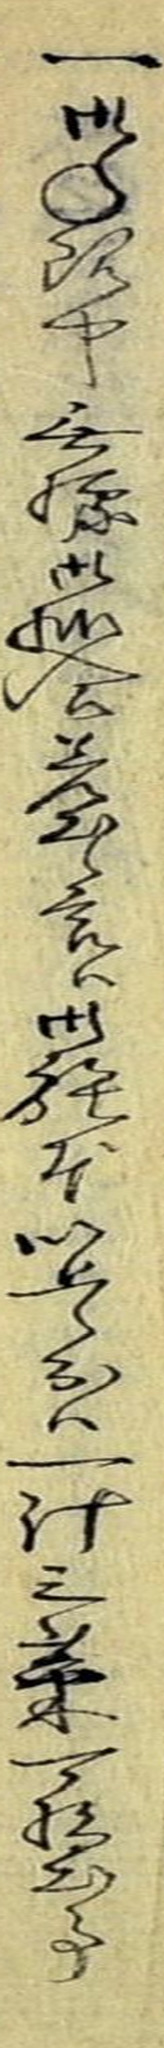一御年限中無拠御掛合差出候節は御旗本以上之分は一汁三菜可指出事
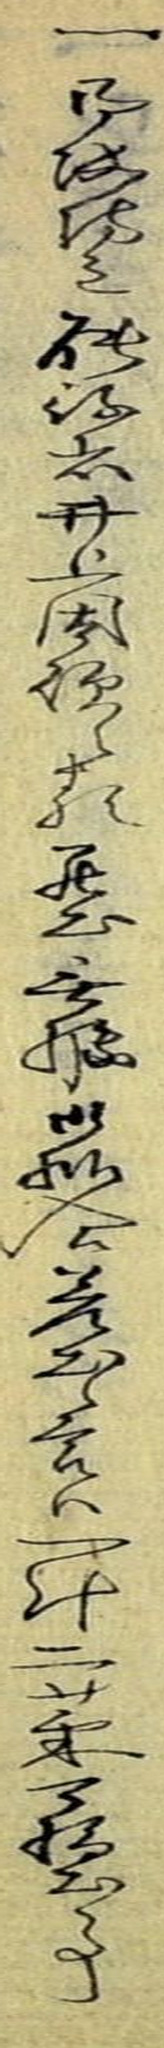一御城坊主能役者井上因碩之類罷出無拠御掛合差出候節は一汁二菜可指出事
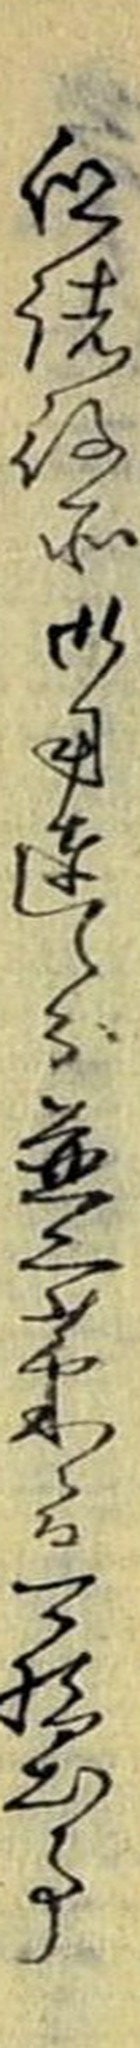但諸役所御用達之分並二菜に而可指出事
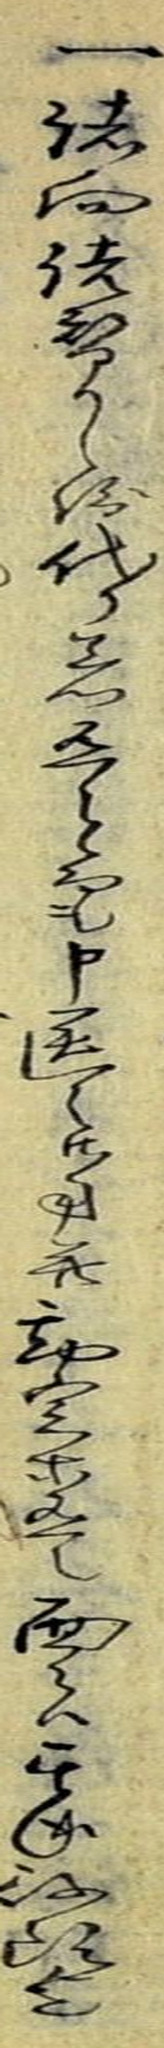一諸向詰替り之儀代り着有之候而も申送之御用并勘定等有之面々は其趣役頭迄
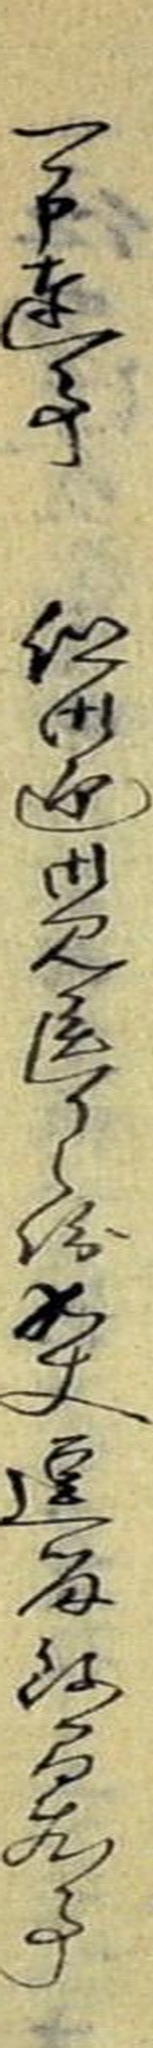可申達事但御迎御見送り之儀成丈逗留致間敷事
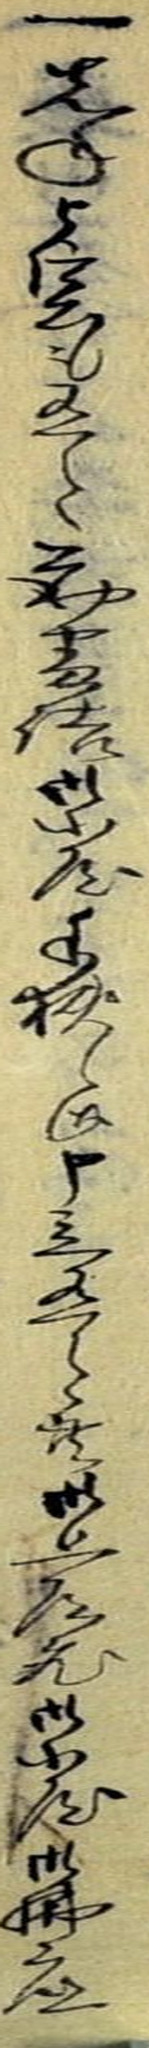一先年被仰出も有之候勤番詰御小屋手狭之趣申立有之候共御上屋敷御小屋御払底
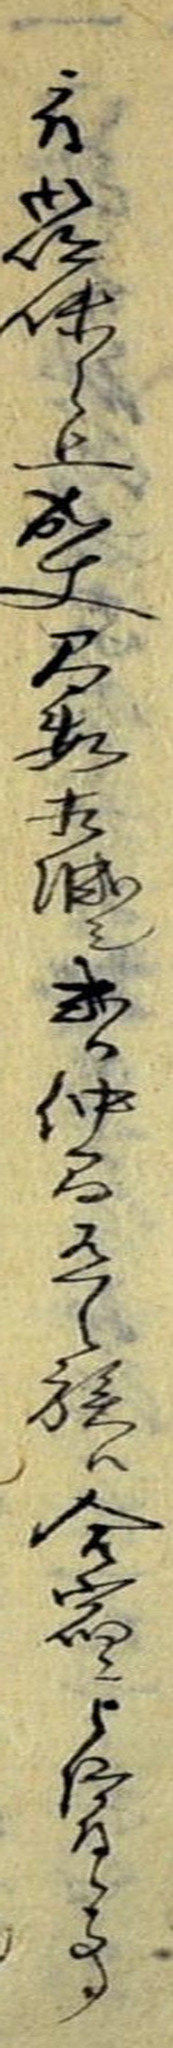に付御吟味之上成丈間数相減し或は仲間有之族は合宿に被仰付候事
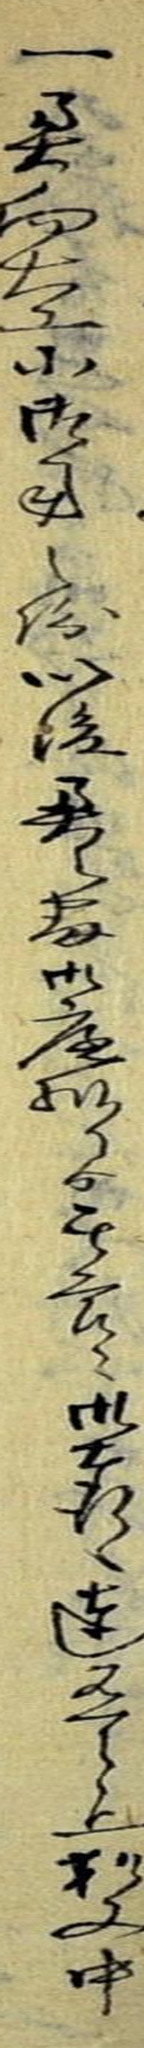一奥向大工所御用之儀以後奥之番御庭掛りゟ其節々御奉行へ達有之上猶又中
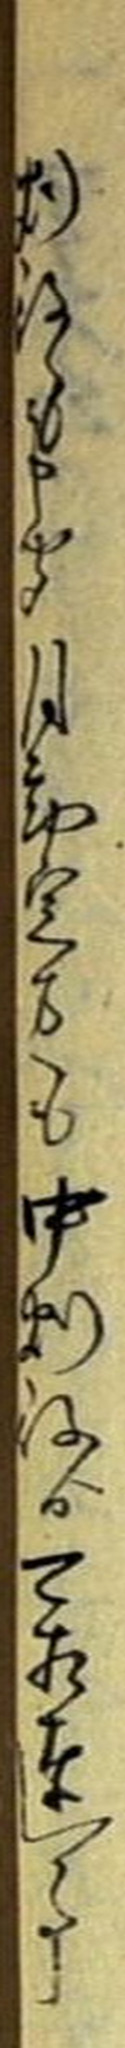判役へも申聞月勘定方へも中判役ゟ可相達事
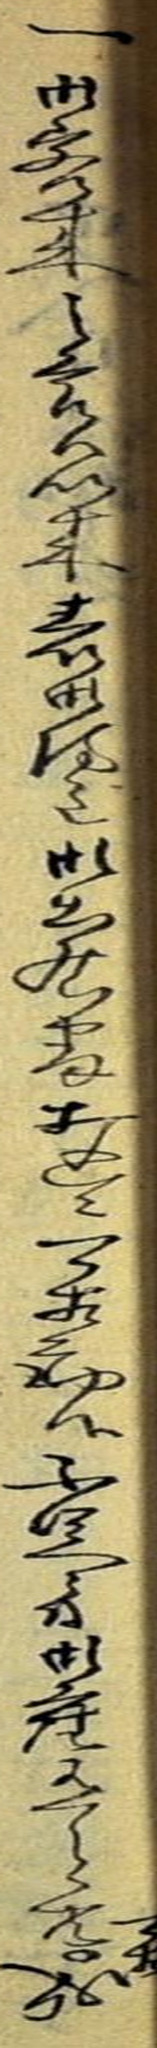一御客來之節は以来表御坊主御出居番打込に可相勤候不足に付御雇有之候共可相成
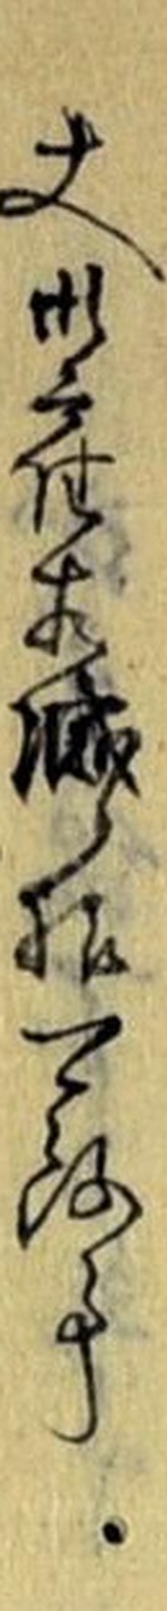丈御雇相減候様可致事
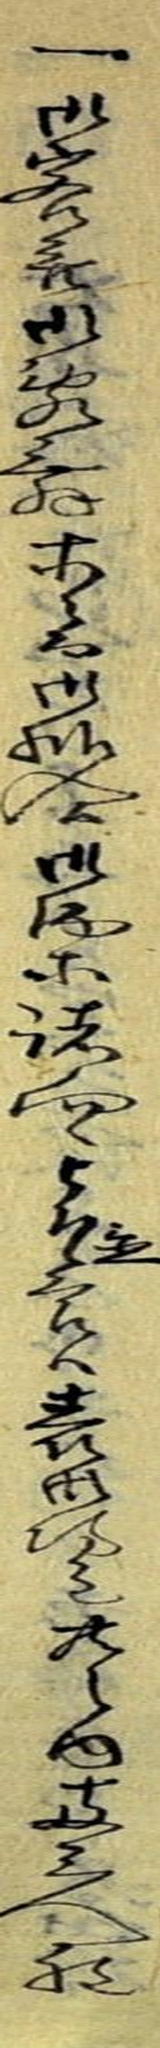一御客并御台舞等に而御掛合御酒等諸向へ被下置節は表御坊主共之内両三人程
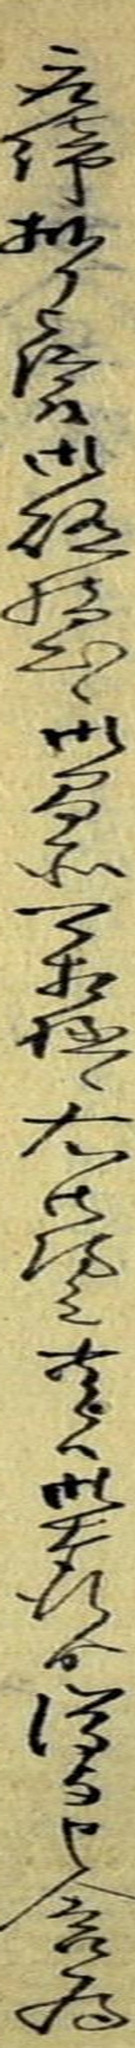取締掛り被仰付御賄指出候御間所可相極候右御坊主共へは御奉行ゟ得と申含為
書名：命令之部 四
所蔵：福井県文書館 Fukui Prefectural Archives
